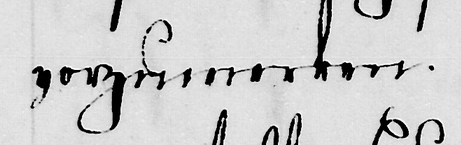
vorzunehmen.
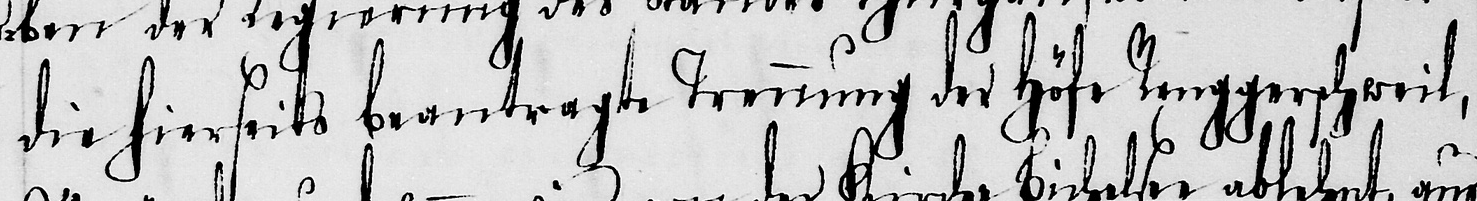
die hierseits beantragte Trennung der Höfe Renggerschweil,
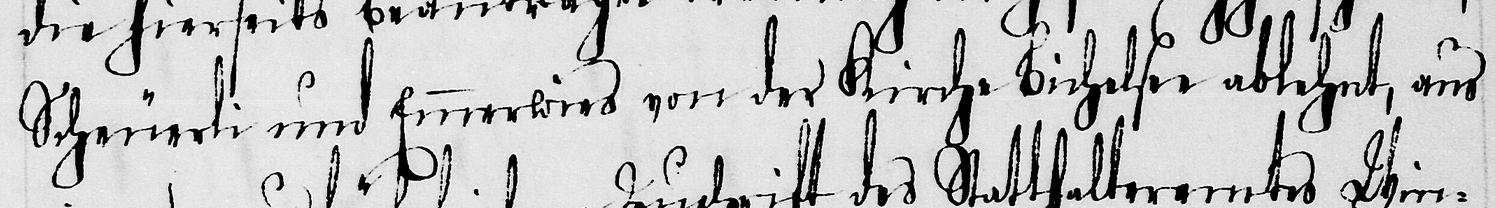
Scheuerli und Emmerwies von der Kirche Bichelsee ablehnt, aus
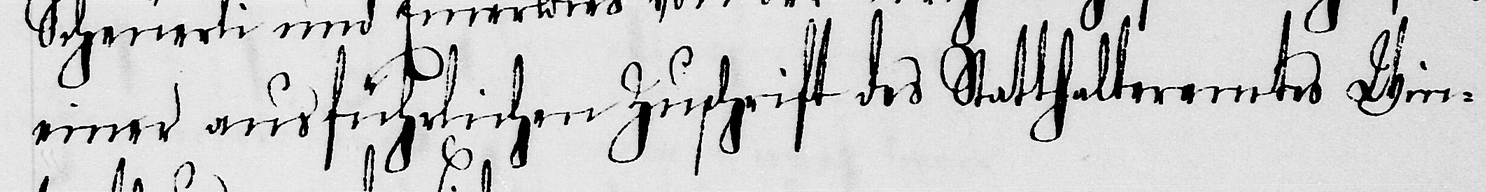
einer ausführlichen Zuschrift des Statthalteramtes Win¬
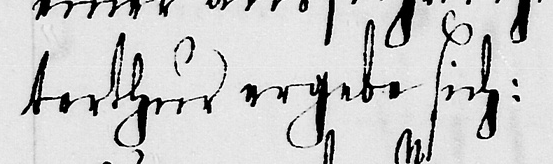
terthur ergebe sich:
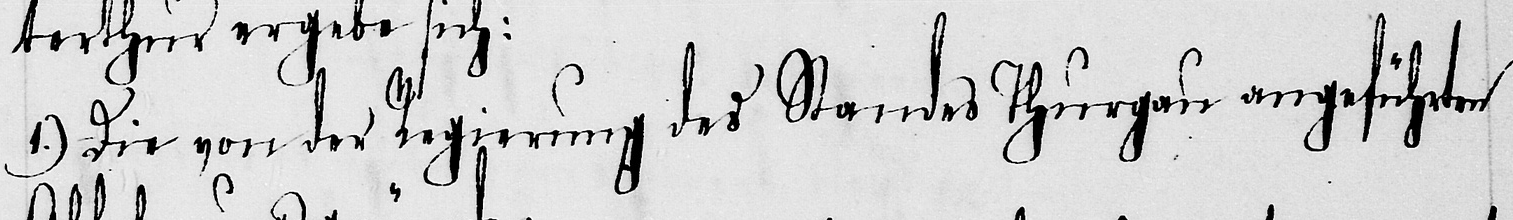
1.) Die von der Regierung des Standes Thurgau angeführten
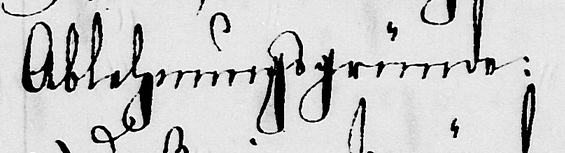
Ablehnungsgründe:
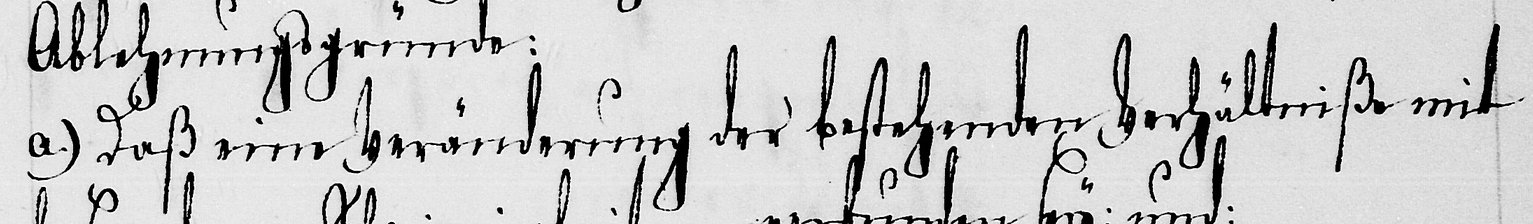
a.) Daß eine Veränderung der bestehenden Verhältniße mit
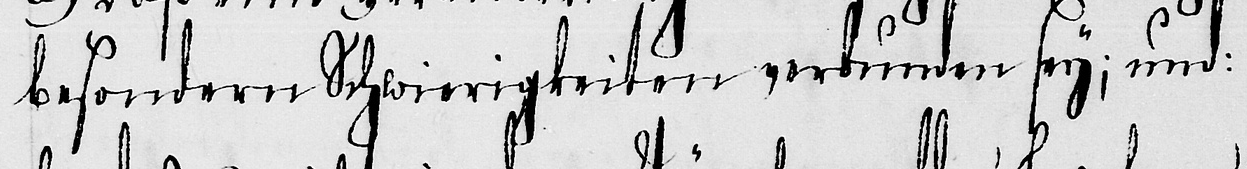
besondern Schwierigkeiten verbunden sey; und:
